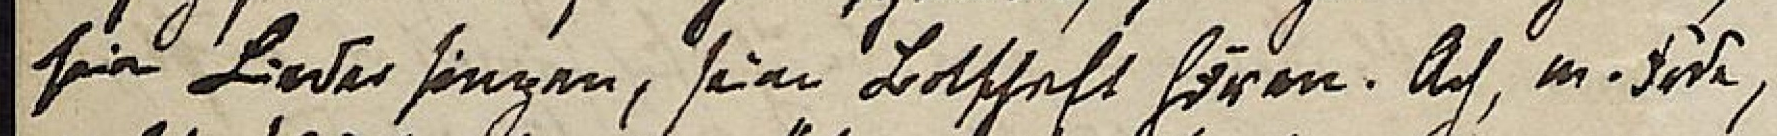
seine Lieder singen, seine Botschaft hören. Ach, m. Frde,
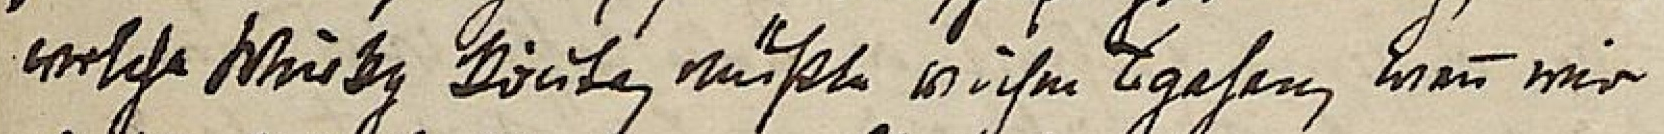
welche Wirkg könte, müßte reiche sgehen, wen wir
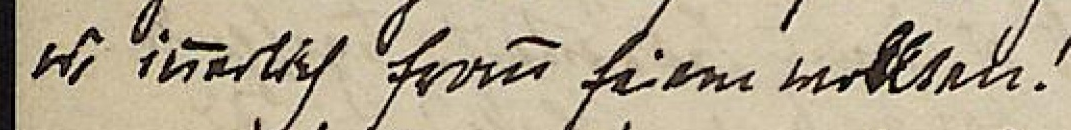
so inerlich from seien wollten!
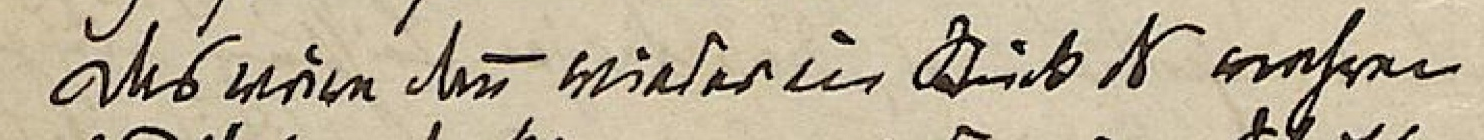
Das wäre dan wieder ein Stück ds wahren
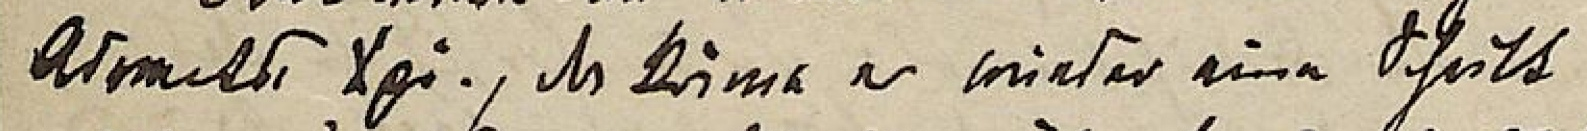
Advents Χρι, da käme er wieder einen Schritt
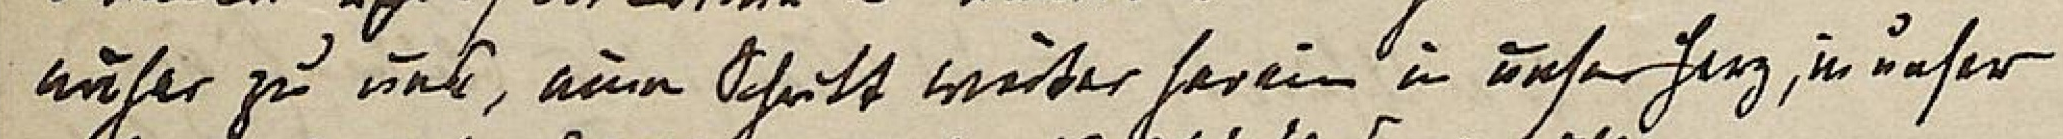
näher zu uns, einen Schritt weiter herin in unser Herz in unser
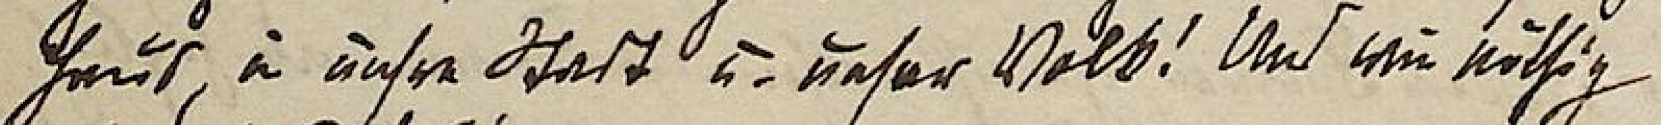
Haus, in unsre Stadt u. unser Volk! Und wie nöthig
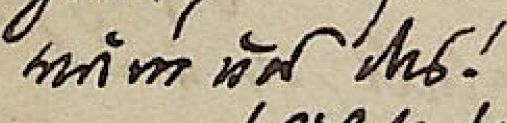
wäre uns das!
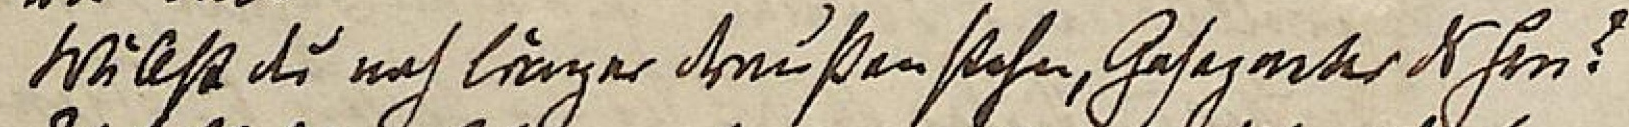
Willst du noch länger draußen stehen, Gesegneter ds. Hrn?
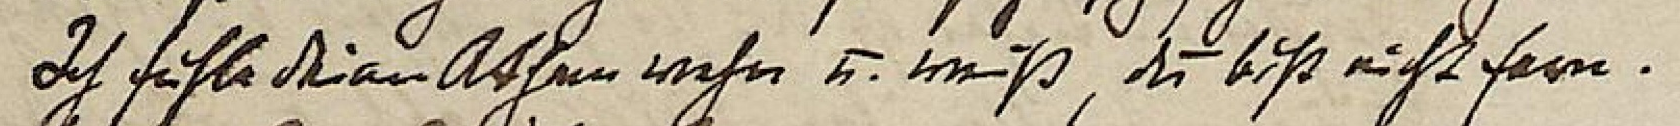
Ich fühle deinen Athem wehn u. weiß, du bist nicht fern.
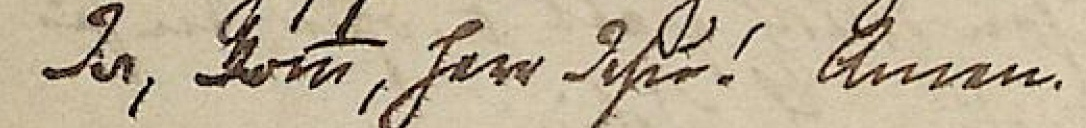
Ja, kom, Herr Jesu! Amen
